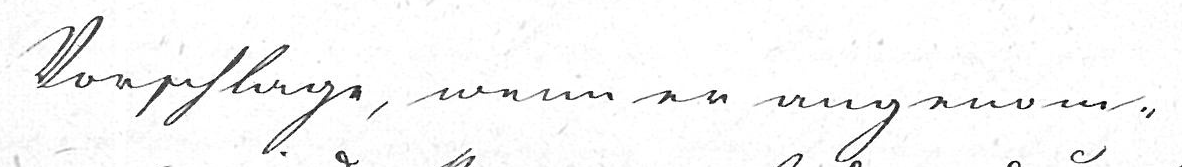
Vorschlage, wenn er angenom-
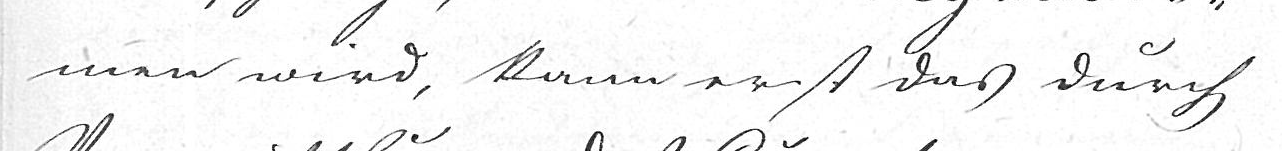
men wird, kann erst das durch
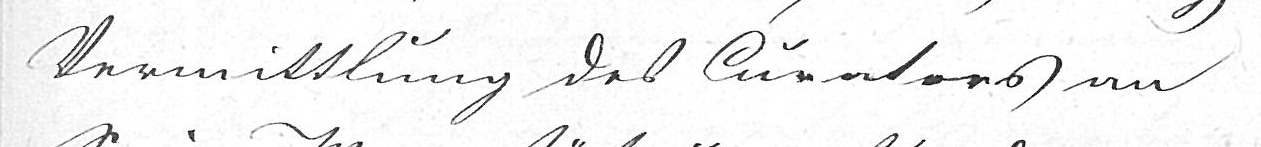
Vermittlung des Curators an
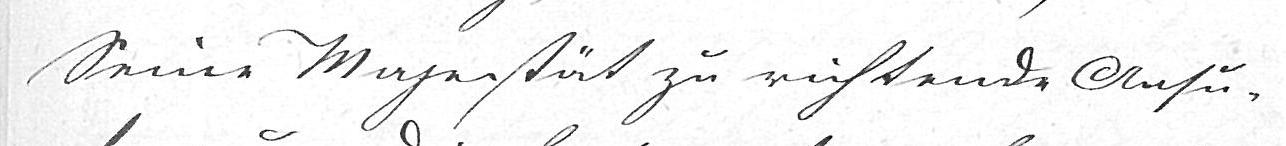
Seine Majestät zu richtende Ansu-
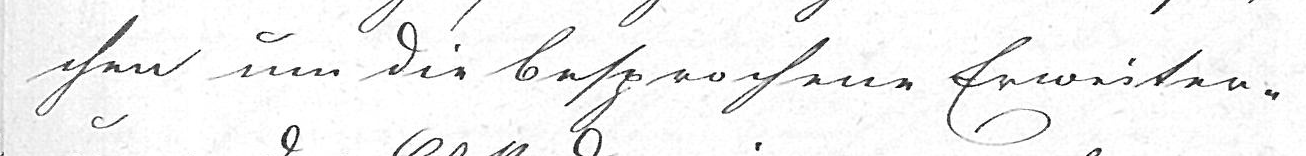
chen um die besprochene Erweiter-
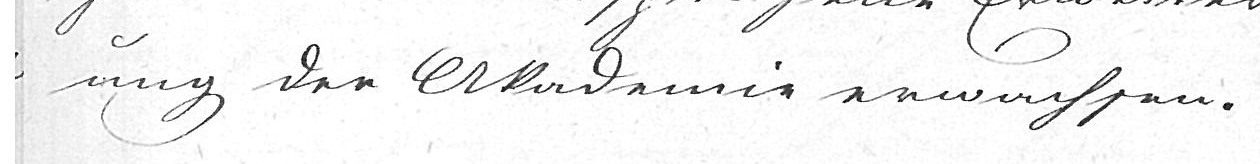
ung der Akademie erwachsen.
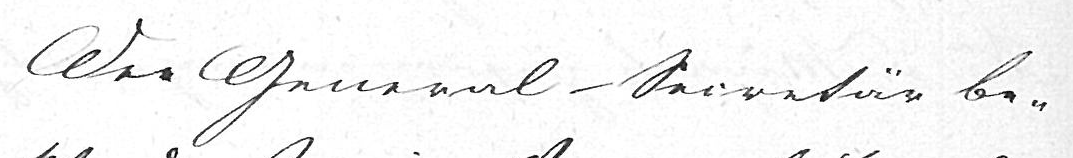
Der General-Secretär be-
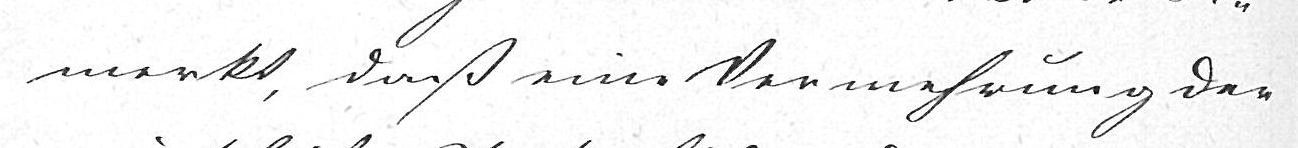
merkt, daß eine Vermehrung der
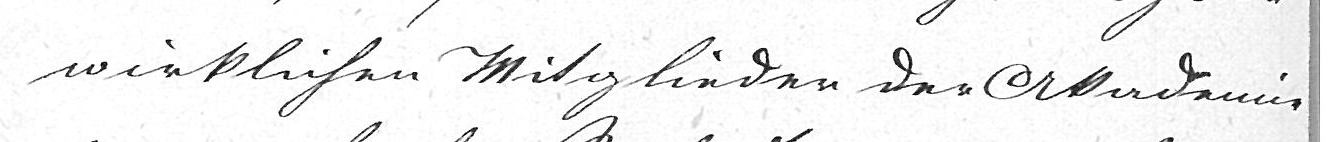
wirklichen Mitglieder der Akademie
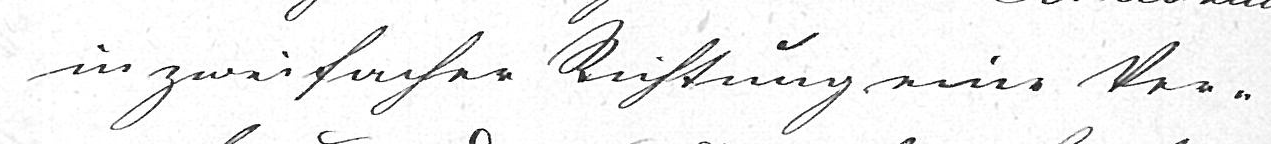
in zweifacher Richtung eine Ver-
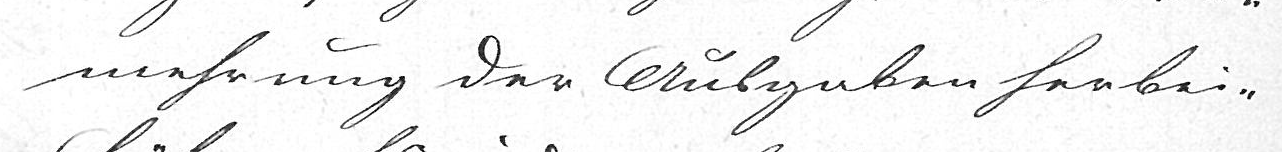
mehrung der Ausgaben hierbei-
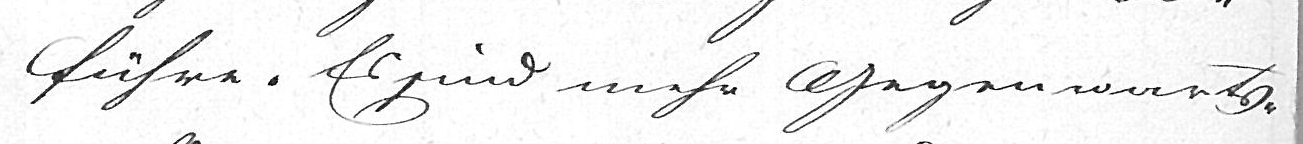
führe. Es sind mehr Gegenwarts-
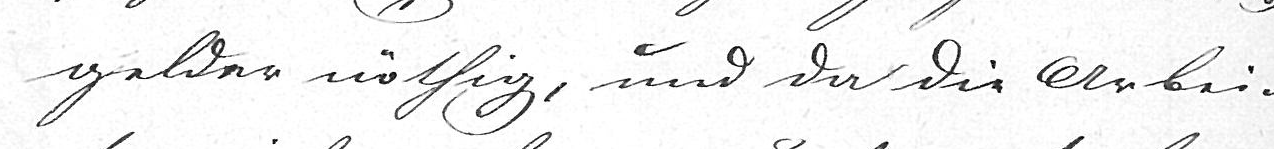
gelder nöthig, und da die Arbei-
